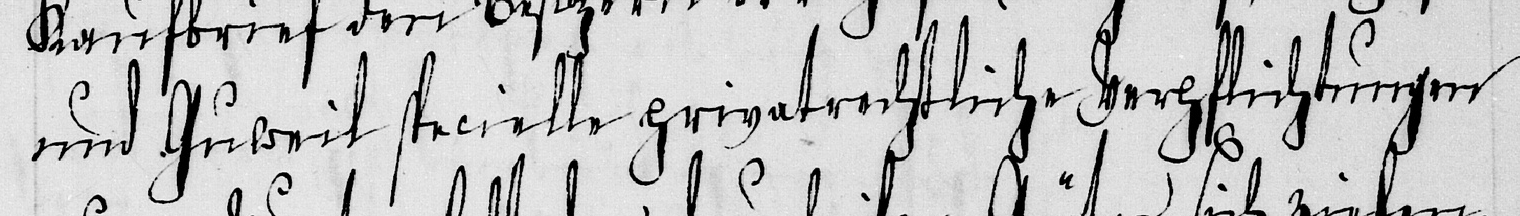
und Guweil specielle privatrechtliche Verpflichtungen
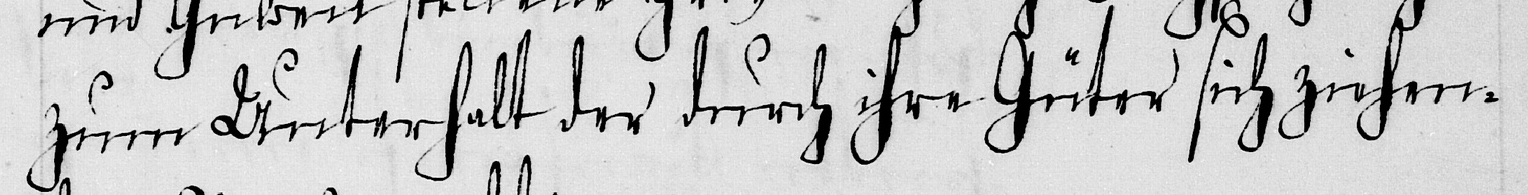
zum Unterhalt der durch ihre Güter sich ziehen¬
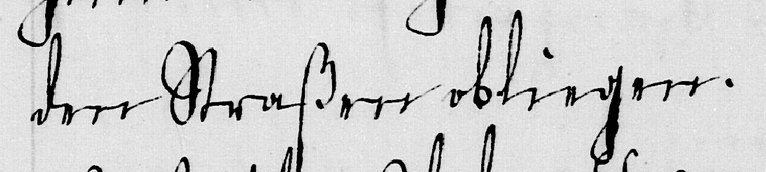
den Straßen obliegen.
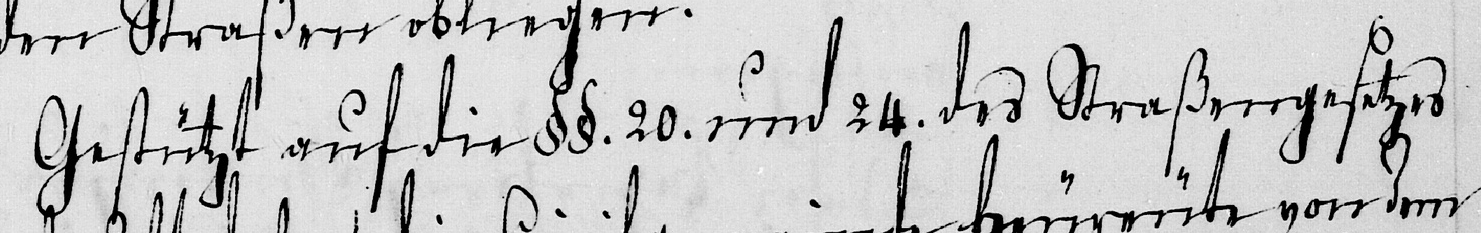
Gestützt auf die §§. 20. und 24. des Straßengesetzes
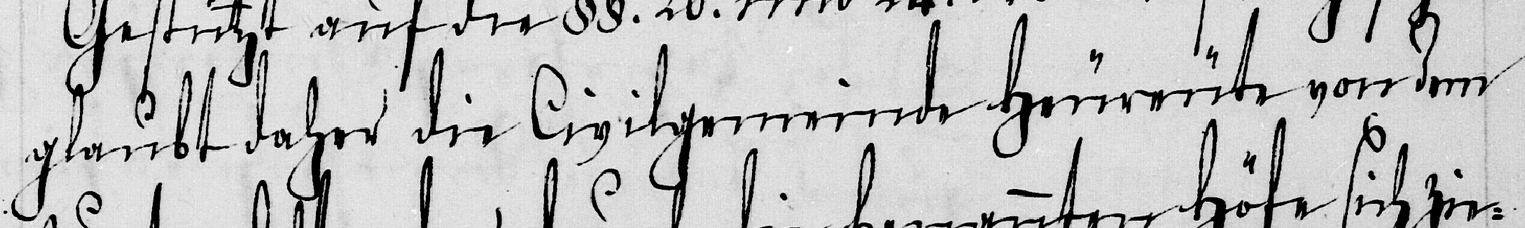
glaubt daher die Civilgemeinde Heureute von dem
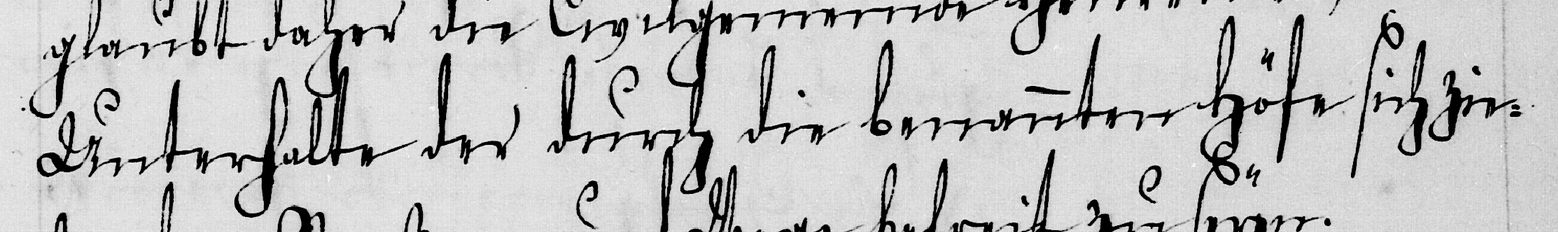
Unterhalte der durch die benannten Höfe sich zi¬
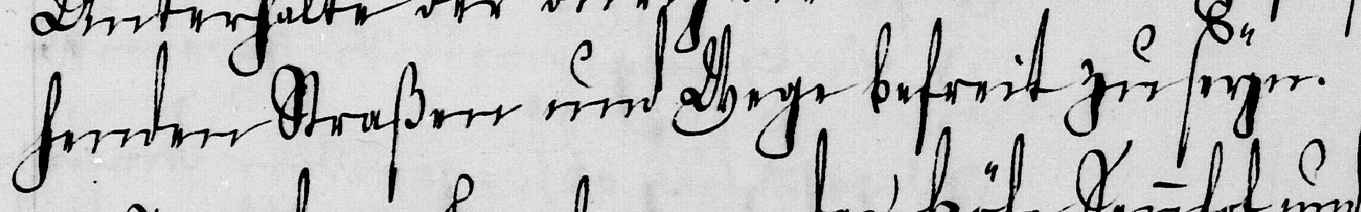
ehenden Straßen und Wege befreit zu seyn.
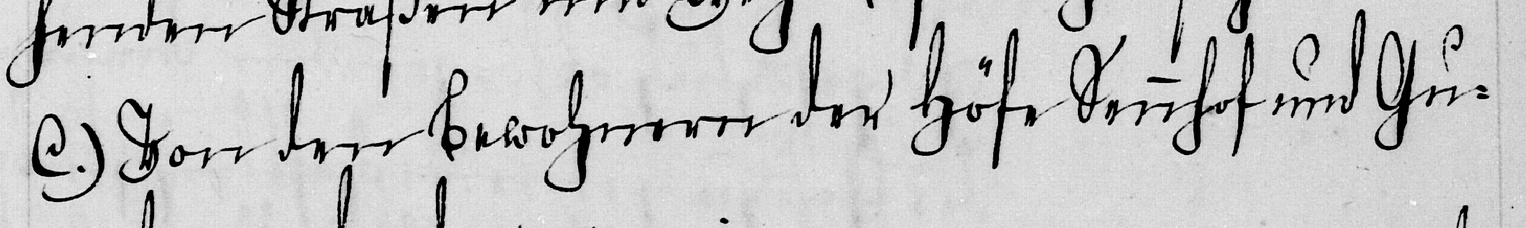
C.) Von den Bewohnern der Höfe Sennhof und Gu¬
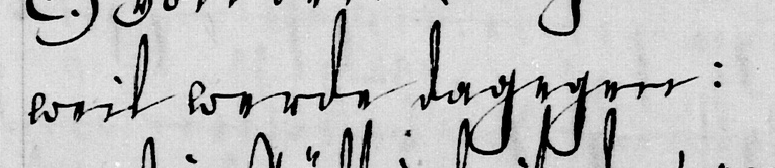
weil werde dagegen:
